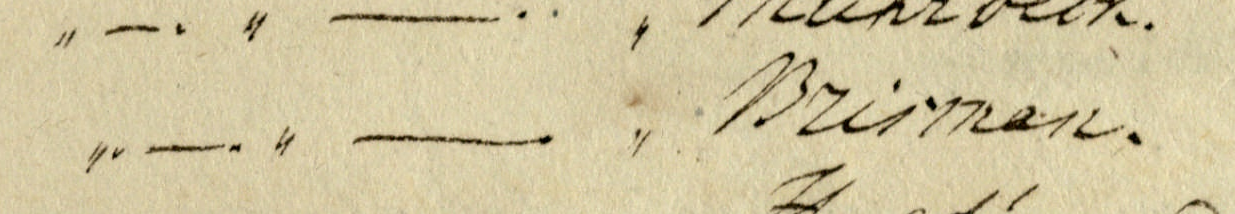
Brisman.
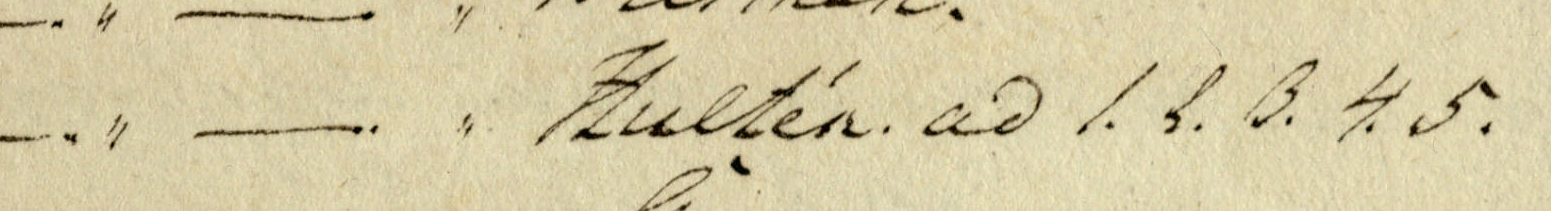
Hultén ad 1. 2. 3. 4. 5.
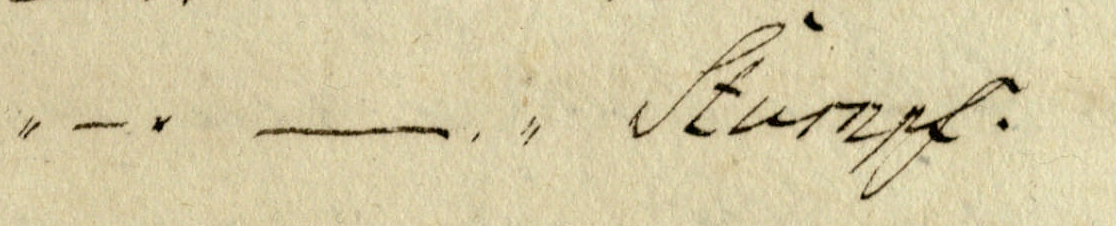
Stumpf.
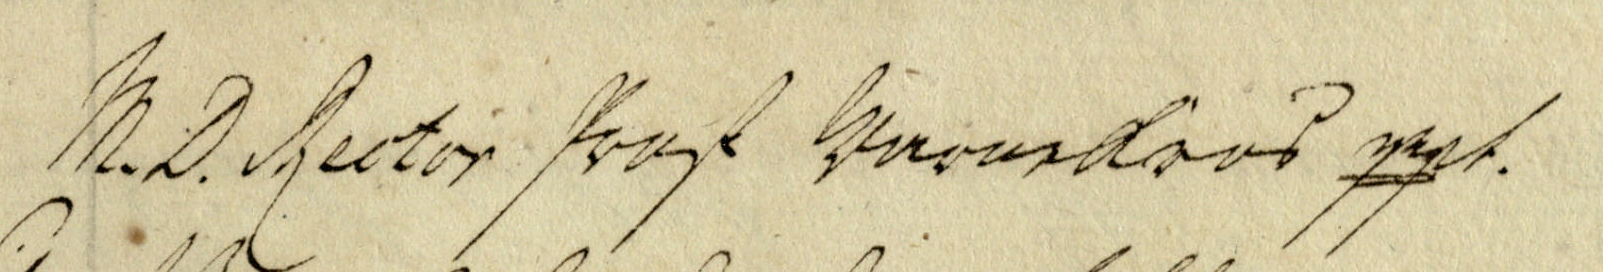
M. D. Rector Prof. Warnekros ppt.
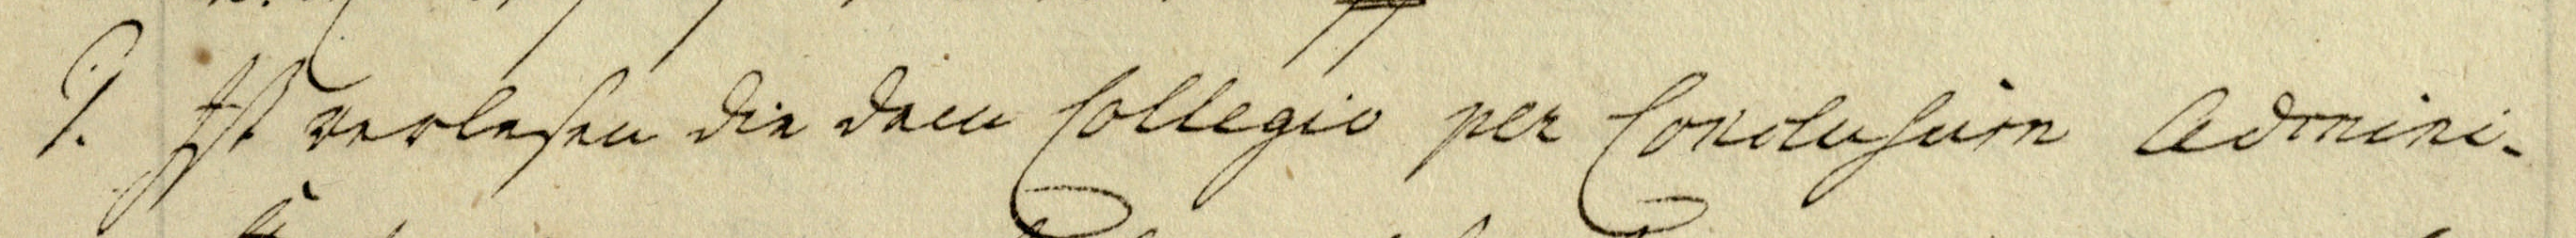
1. Ist verlesen die dem Collegio per Conclusum Admini¬
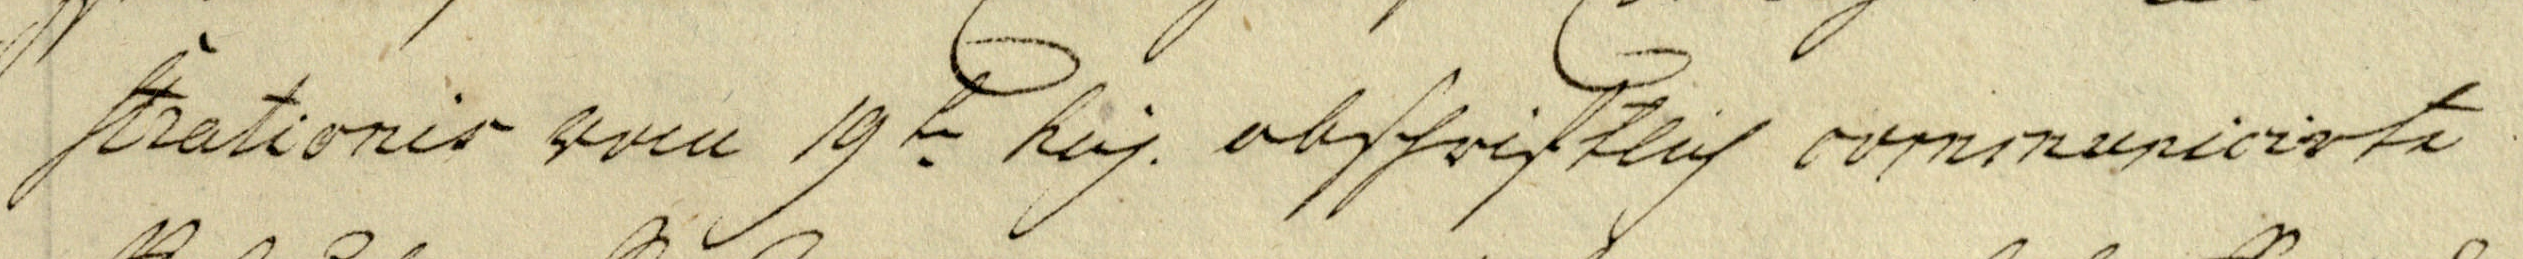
strationis vom 19 te. huj. abschriftlich communicirte
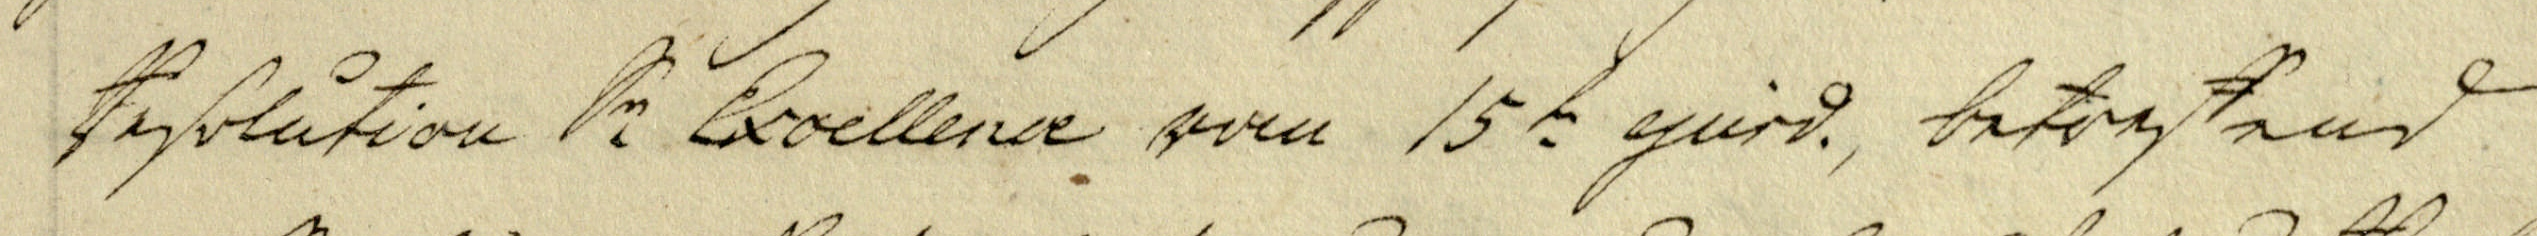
Resolution Sr Excellence vom 15 t. ejusd., betreffend
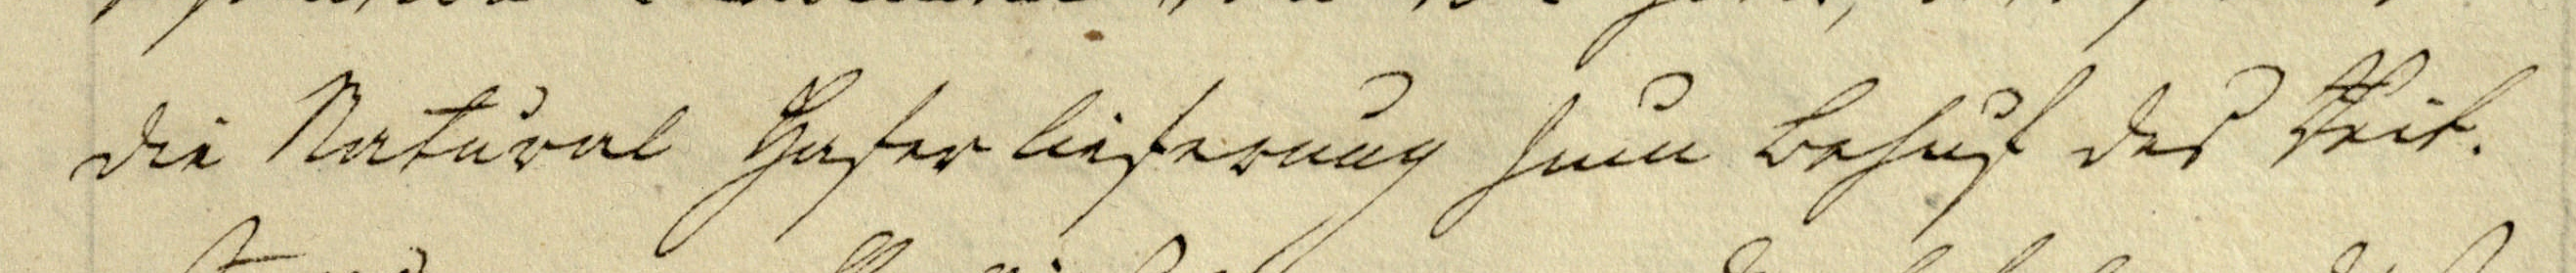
die Natural Haferlieferung zum Behuf des Reit¬
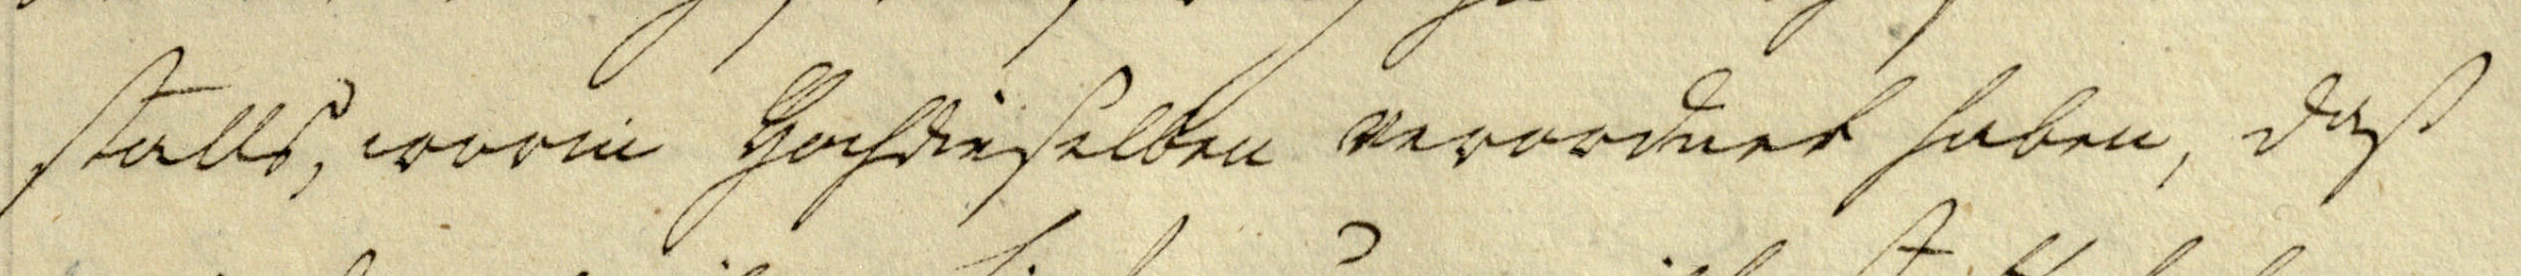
stalls, worin Hochdieselben verordnet haben, daß
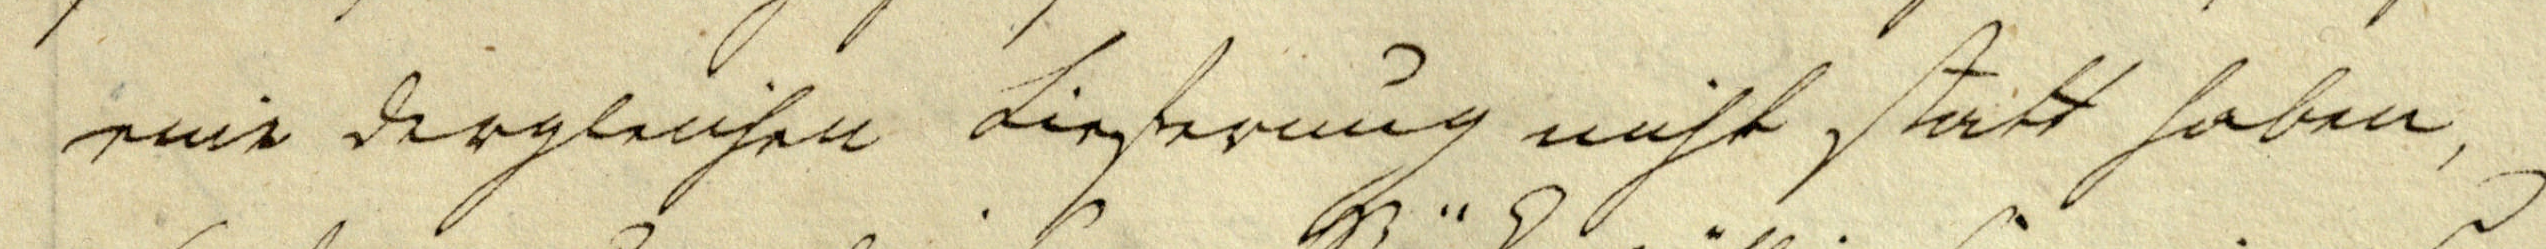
eine dergleichen Lieferung nicht statt haben,
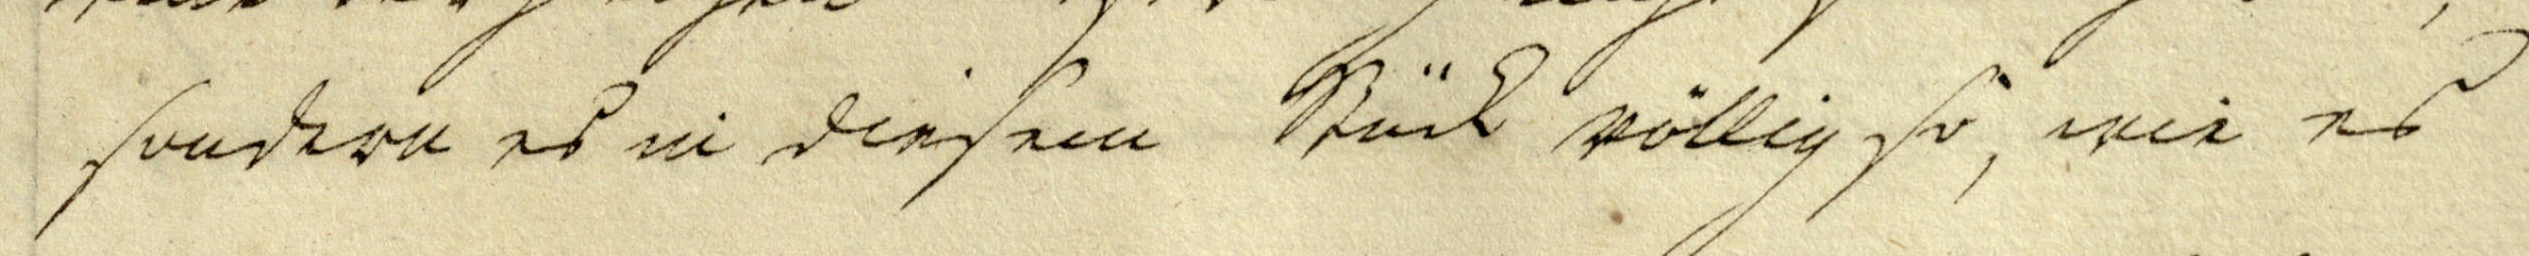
sondern es in diesem Stück völlig so, wie es
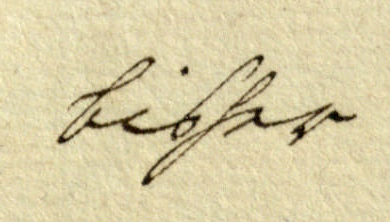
bisher
